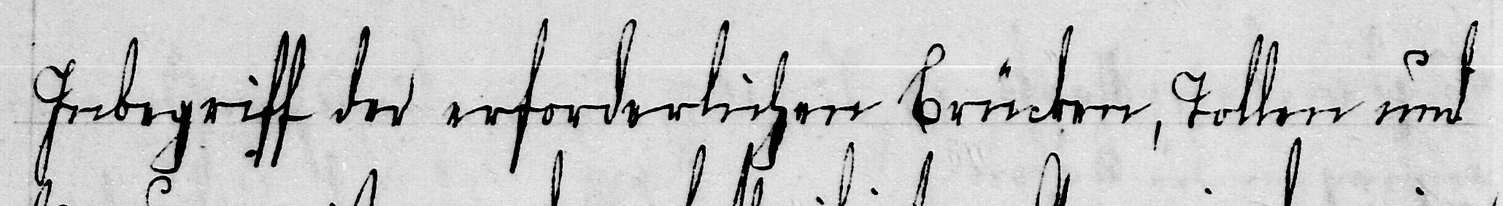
Inbegriff der erforderlichen Brücken, Tollen und
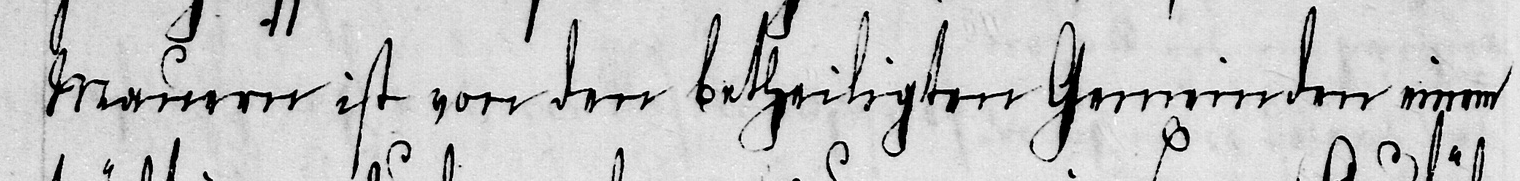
Mauern ist von den betheiligten Gemeinden einem
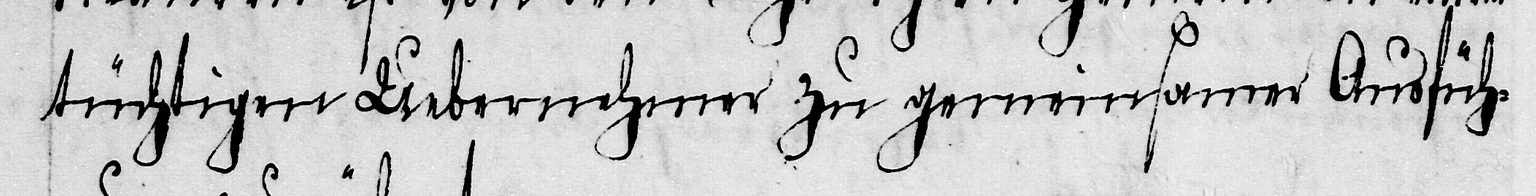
tüchtigen Uebernehmer zu gemeinsamer Ausfüh¬
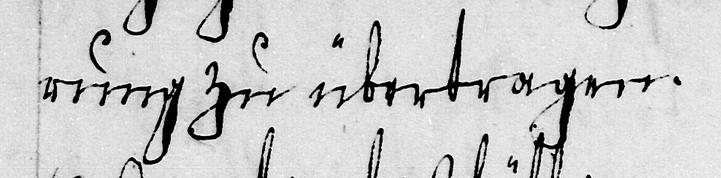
rung zu übertragen.
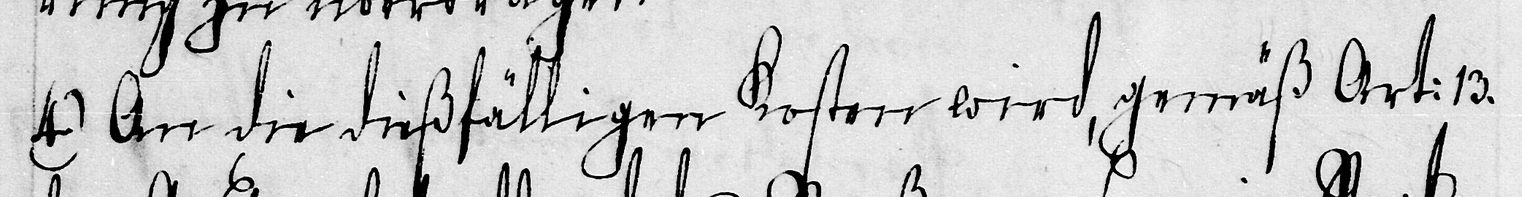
4.) An die dießfälligen Kosten wird, gemäß Art: 13.
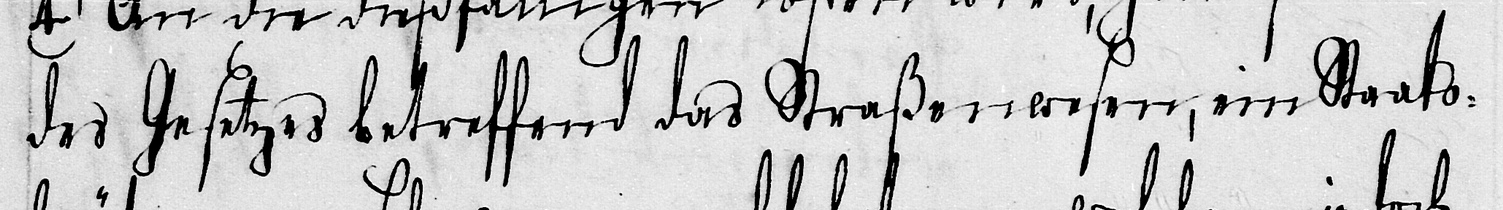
des Gesetzes betreffend das Straßenwesen, ein Staats¬
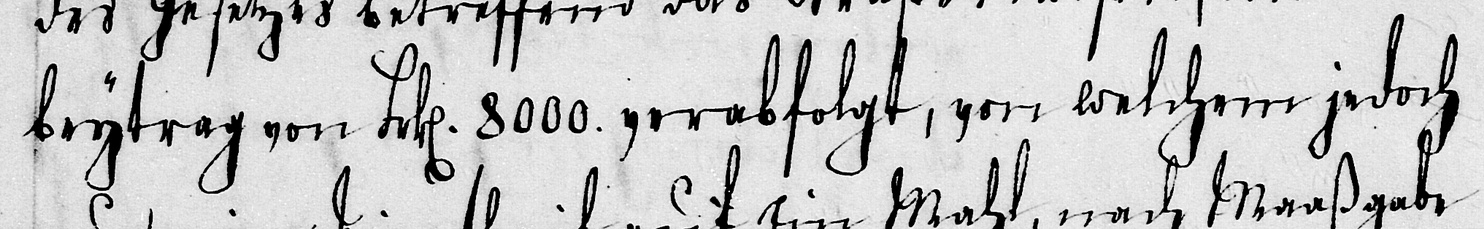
beytrag von Frk[en]. 8000. verabfolgt, von welchem jedoch
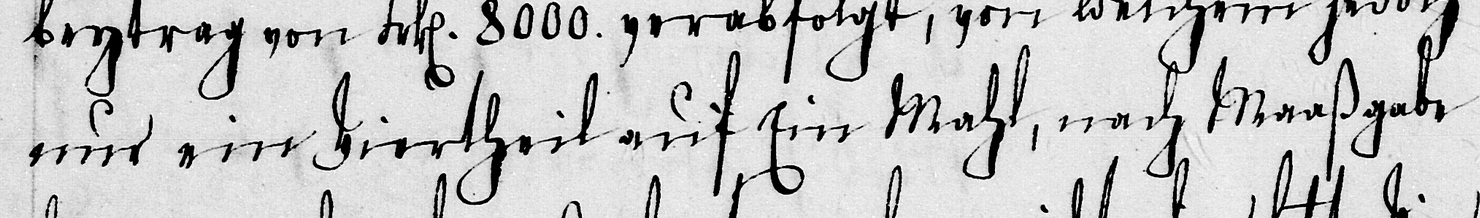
nur ein Viertheil auf Ein Mahl, nach Maaßgabe
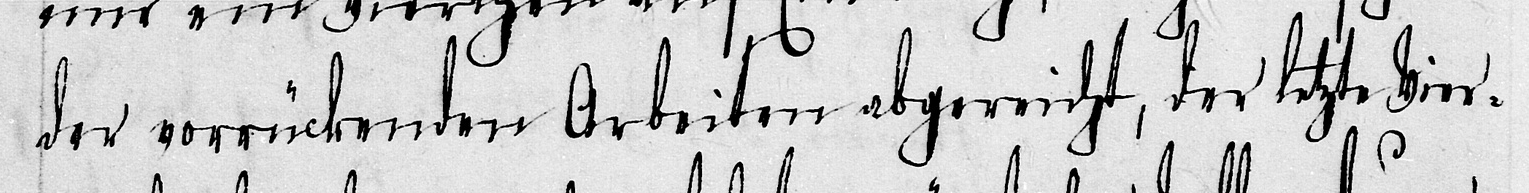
der vorrückenden Arbeiten abgereicht, der letzte Vier¬
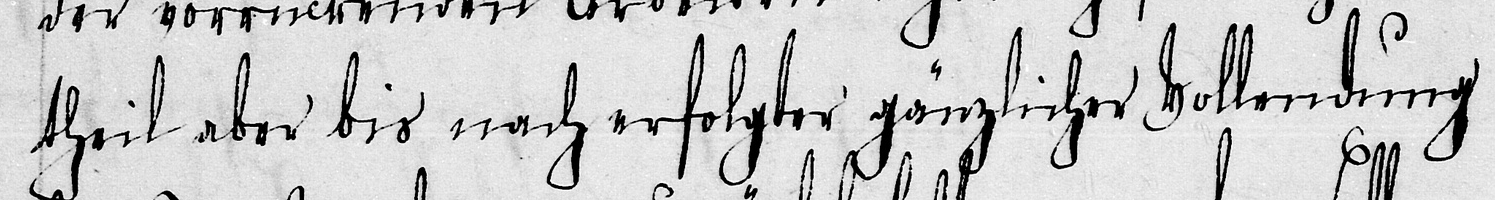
theil aber bis nach erfolgter gänzlicher Vollendung
